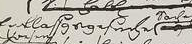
Entlassungsgesuche es uns
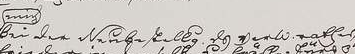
bei der Neubestellg. des Verw.rathes
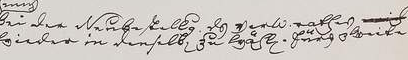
wieder in denselben zu wählen – Fürs zweite sind
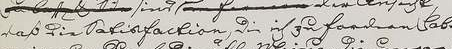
daß die Satisfaction, die ich zu fordern habe,
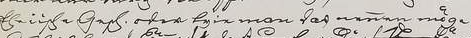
theiische Gesch. oder wie man das nennen möge
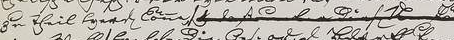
zu Theil werden könne, |& daß unter diesen Umständen
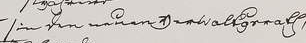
in den neuen Verwaltungsrath,
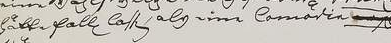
hätte fallen lassen, als eine Comödie erschienen
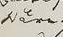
wäre.
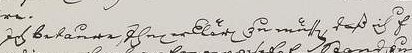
Ich bedaure, Ihnen erklären zu müssen, daß ich auf
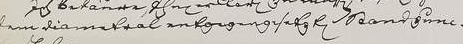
dem diametral entgegengesetzten Standpunc-
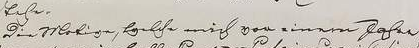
Die Motive, welche mich vor einem Jahre
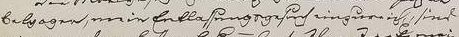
bewogen, mein Entlassungsgesuch einzureichen, sind
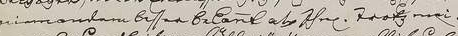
niemandem besser bekannt als Ihnen. Trotz mei-
